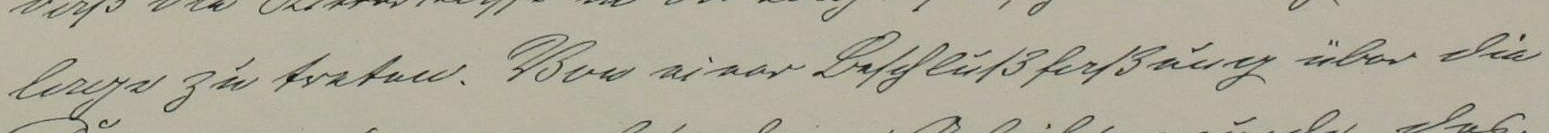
lage zu treten. Von einer Beschlußfaßung über die
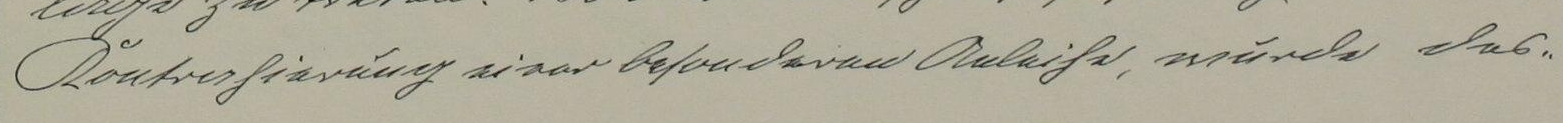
Kontrahierung einer besonderen Anleihe, wurde des-
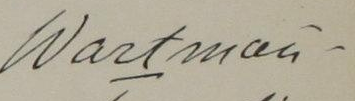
Wartmann-
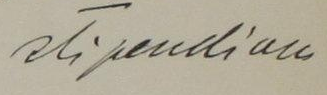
stipendium
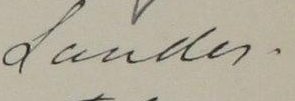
Landes-
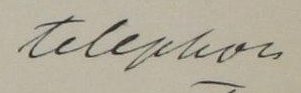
telephon
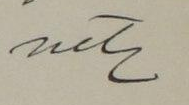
netz
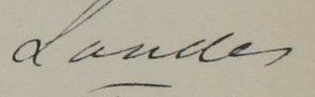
Landes
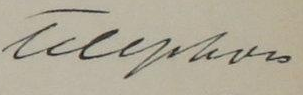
telephon
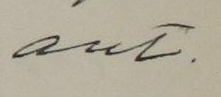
amt.
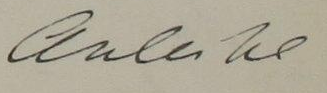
Anleihe
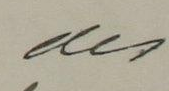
des
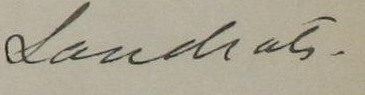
landrats-
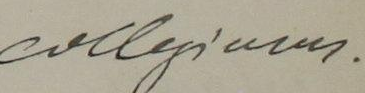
collegiums
